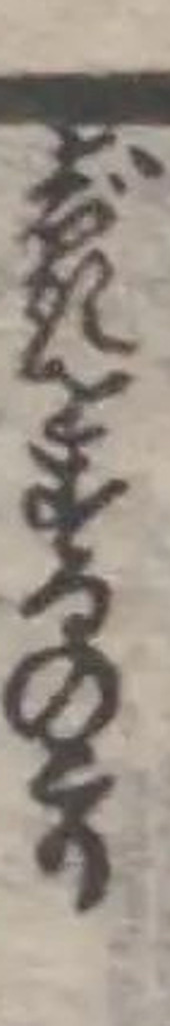じきをするのこり
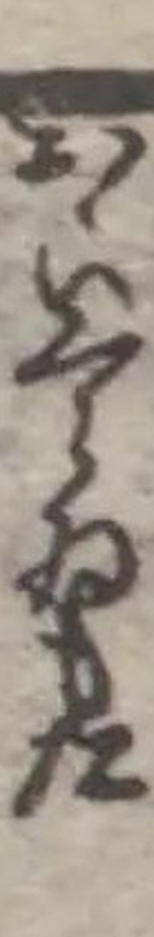おゝいくらゐもた
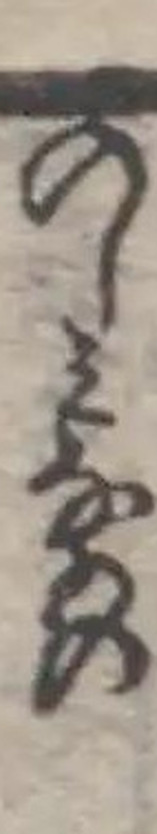のしみなもの
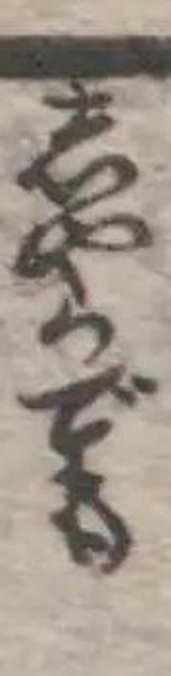しやかでも
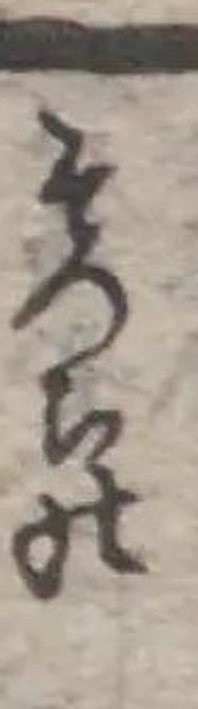そつちの
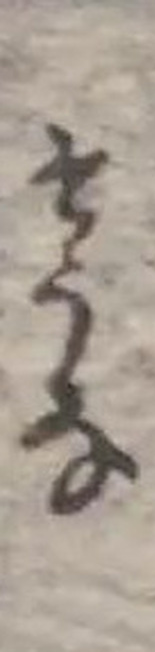そうな
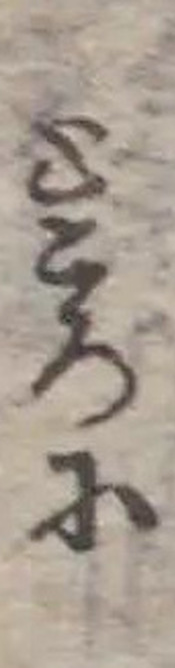ところに
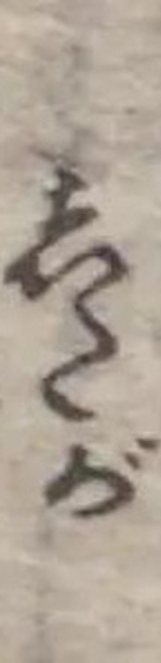したが

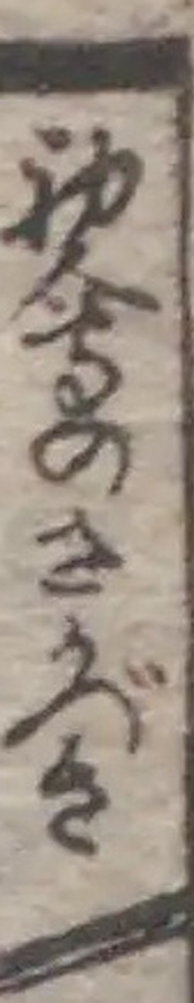初会のさかづき
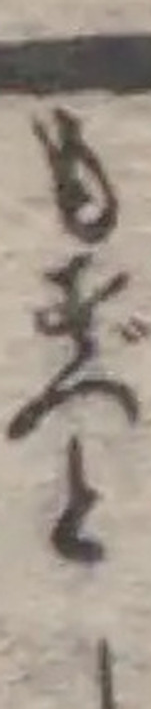もずつと
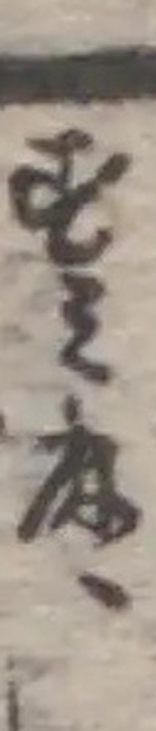すみ床へ
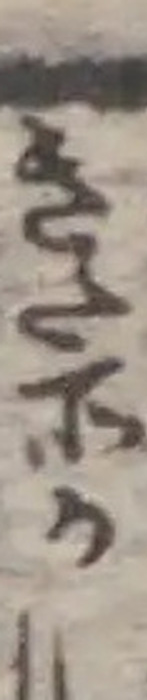きた所か
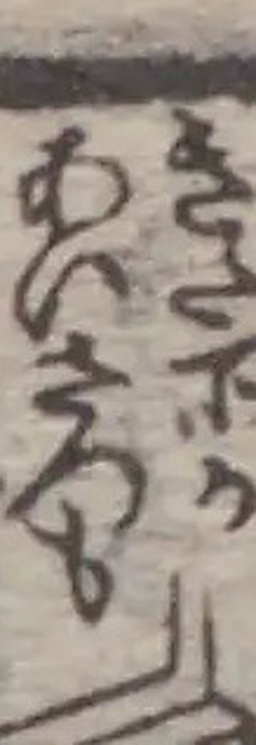あいさつも
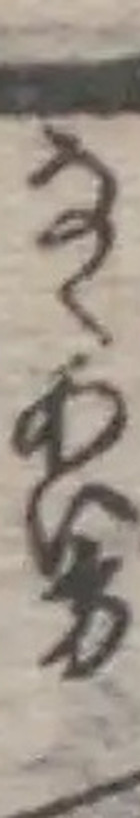なくあい方
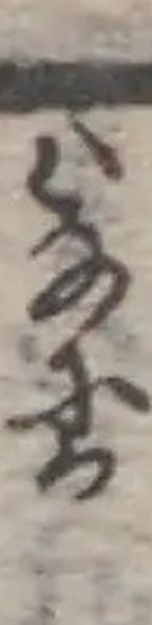はなにか
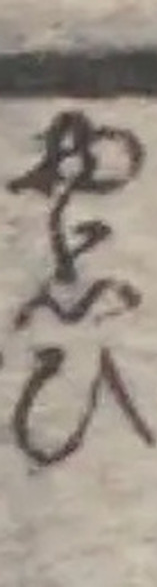物思ひ
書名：早出来 3巻
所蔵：国立国会図書館 National Diet Library, JAPAN
